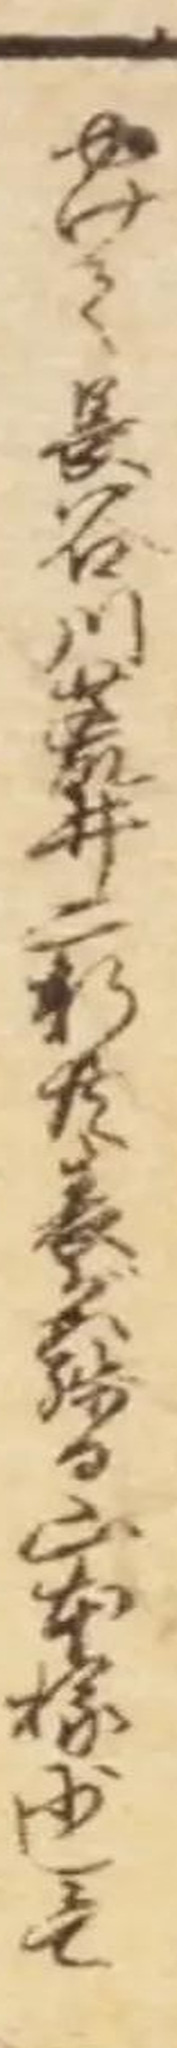やけて長谷川荒井二軒共表がは残る山本様少しとて
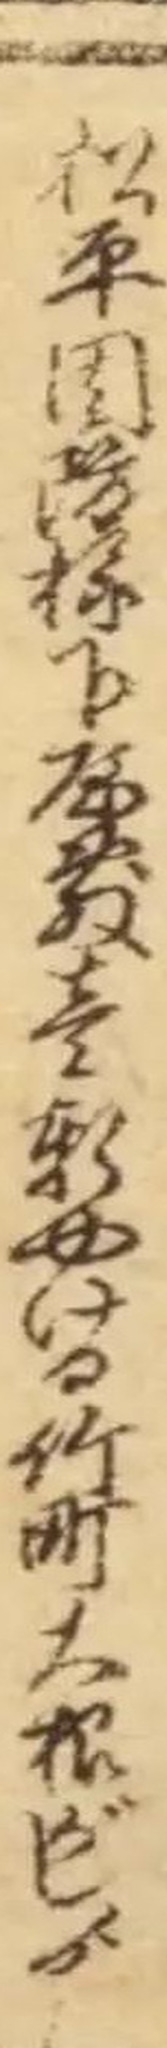松平周防様下屋敷壱軒やける竹町大根がしより
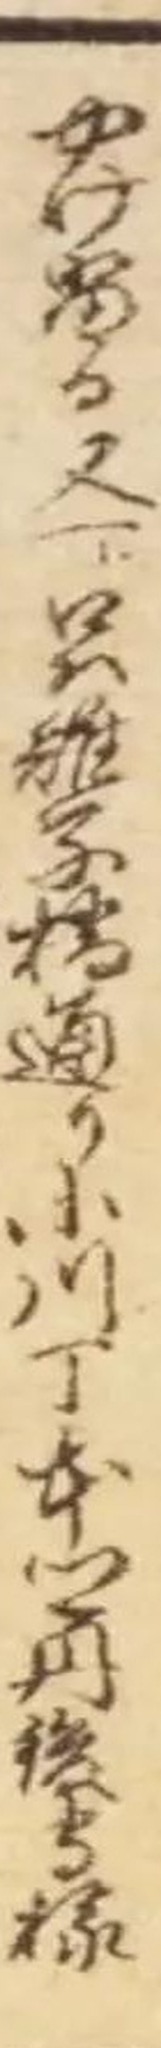やけ留る又一ト口は雉子橋通り小川丁本郷丹後守様
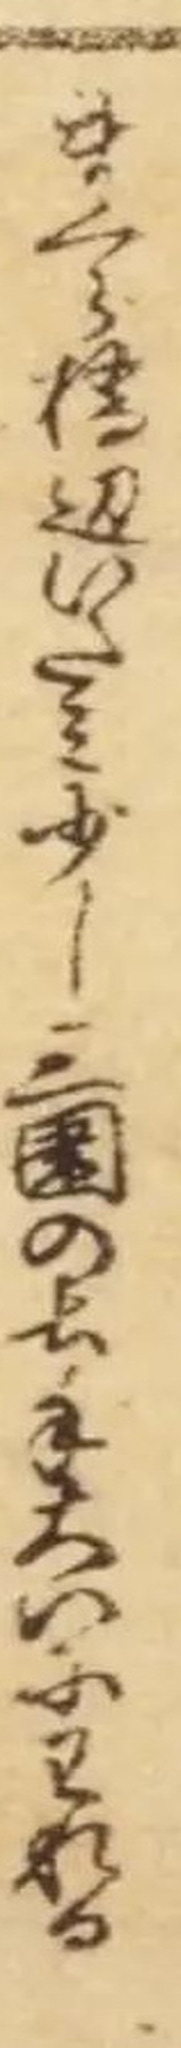まくら橋辺いたみ少し三園の土長の手大いにわれる
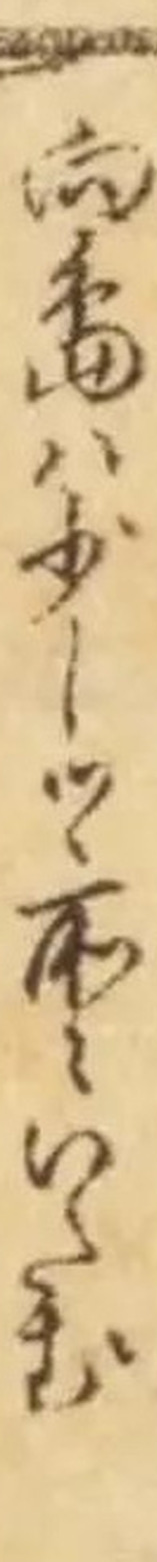向島は少しツヽ所〻いたむ
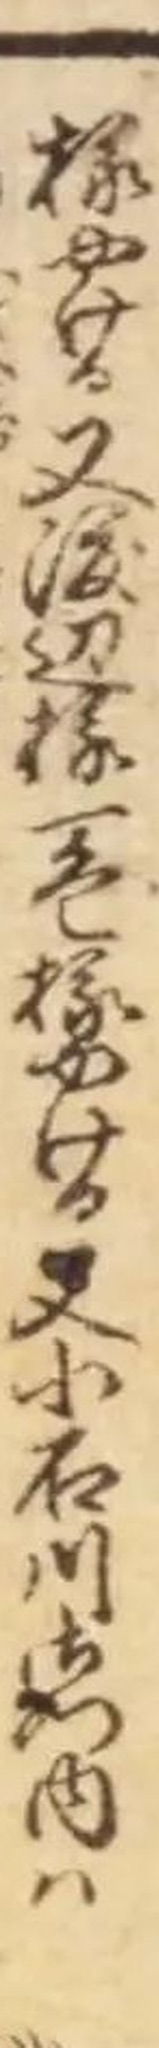様やける又渡辺様一色様やける又小石川御内は
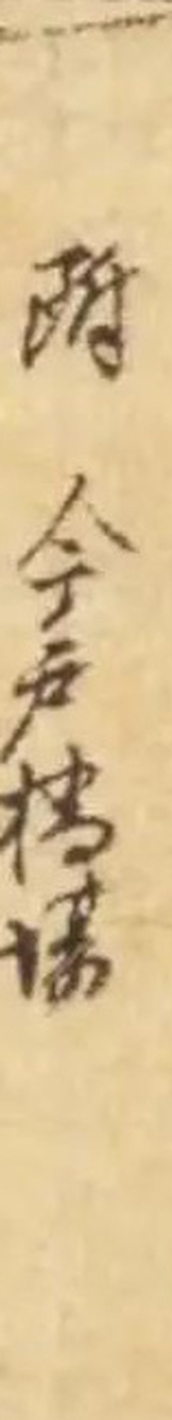附今戸橋場
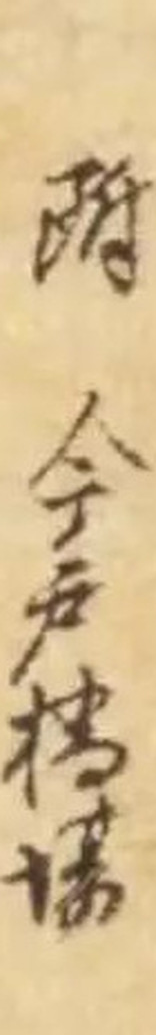附今戸橋場
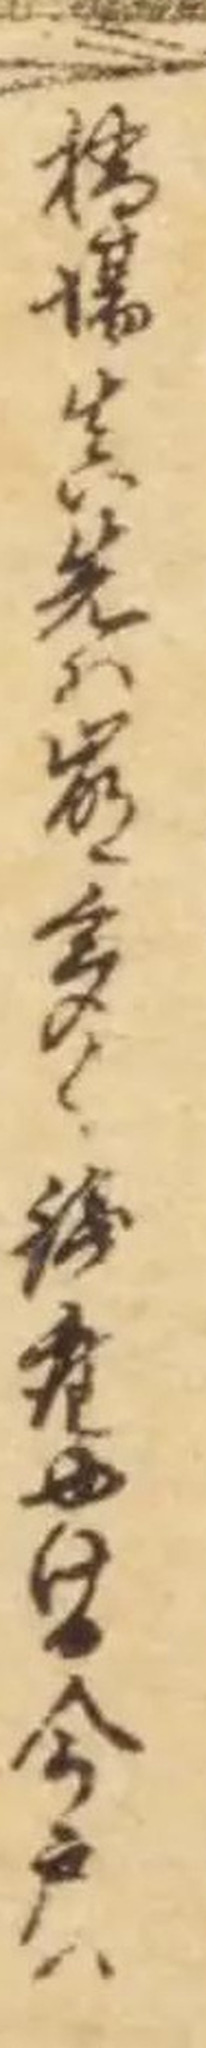橋場真先崩多く銭座やける今戸は
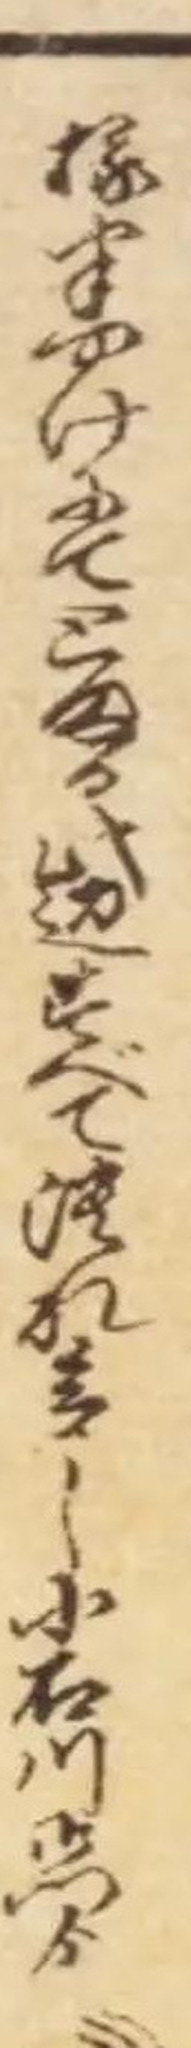様半やけにてとまる此辺すべて潰れ多し小石川御門より
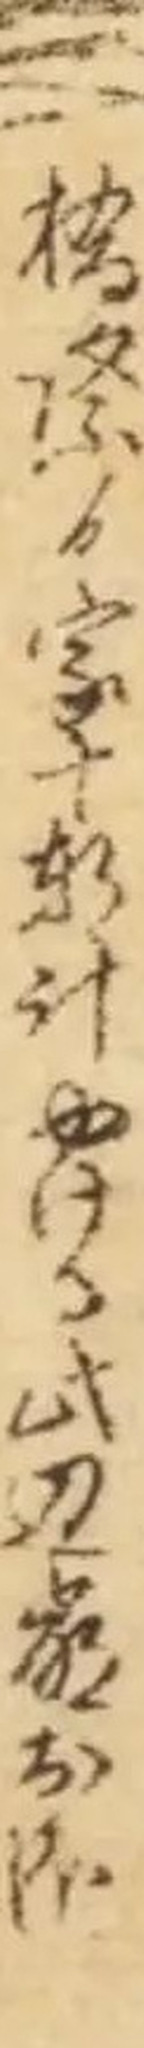橋際より家十軒斗やける此辺崩おほし
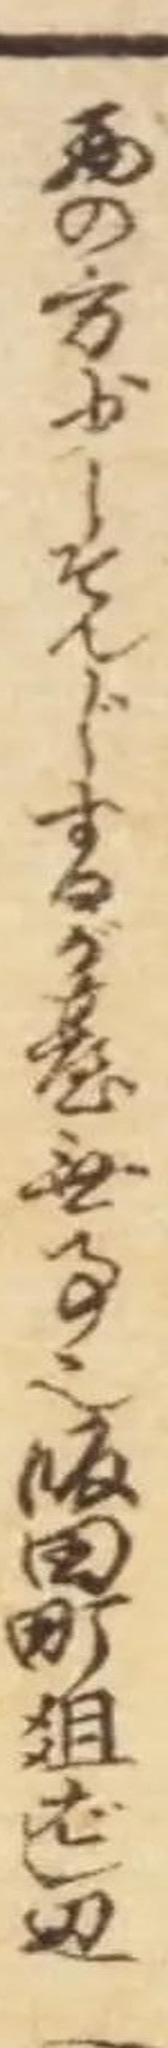西の方少しそんじするが台無事也飯田町辺俎ばし辺
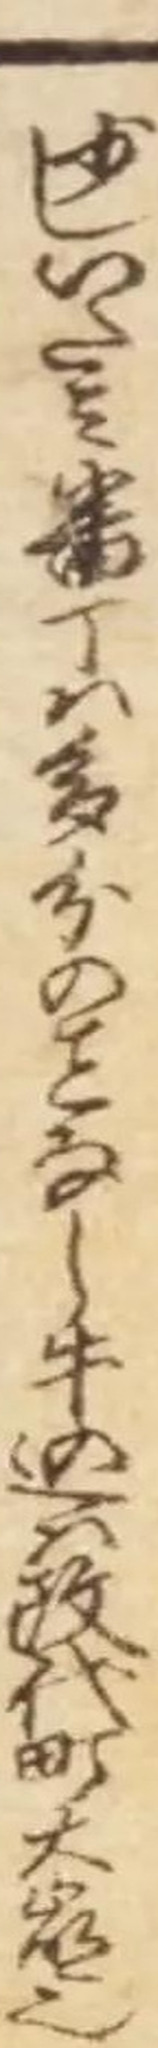少しいたみ番丁は多分のことなし牛込は改代町大崩也
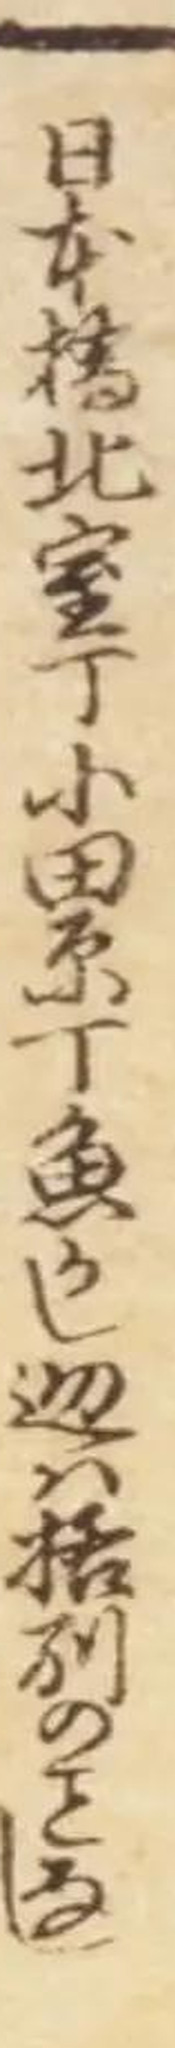日本橋北室丁小田原丁魚かし辺は格別のことなし
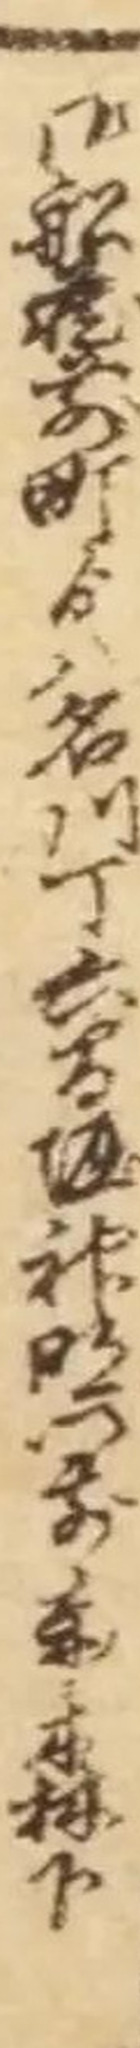御船蔵前町より八名川丁六間堀神明門前南森下
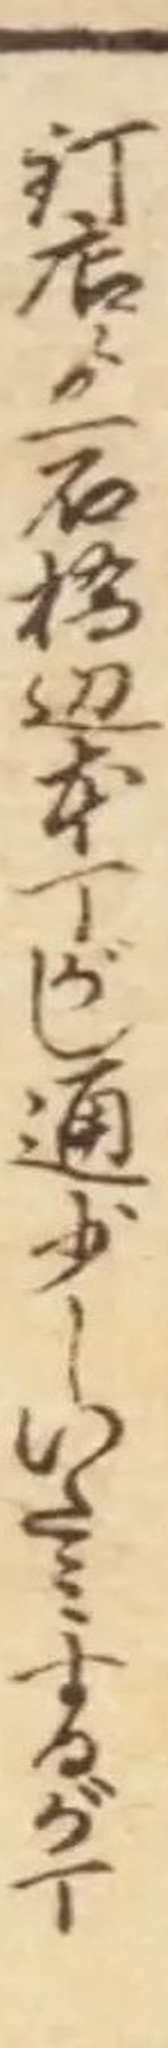釘店より一石橋辺本丁がし通少しいたみするが丁
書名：御江戸関八州大地震出火巨細記
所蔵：国立国会図書館 National Diet Library, JAPAN
